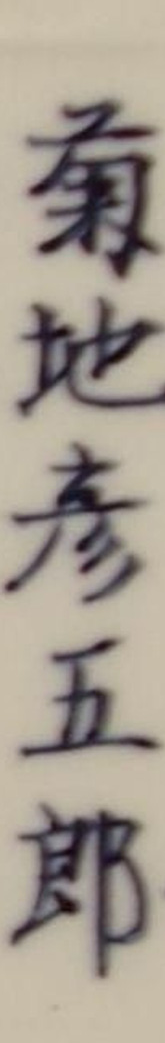菊地彦五郎
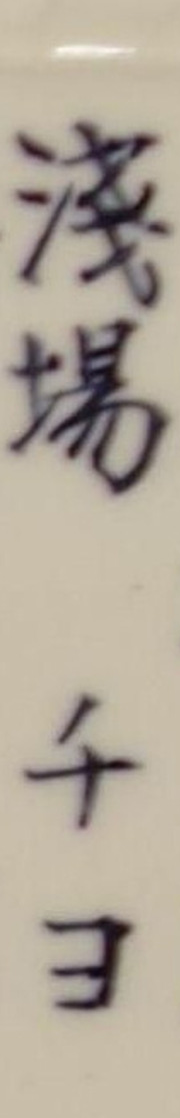浅場チヨ
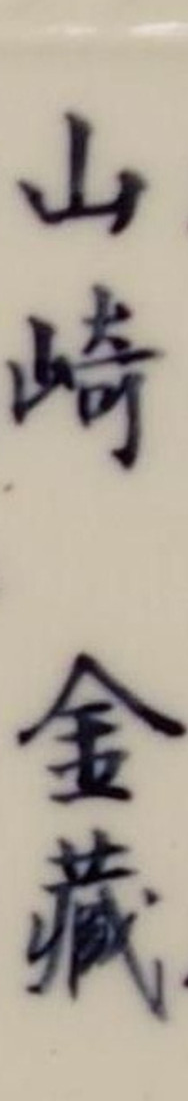山崎金蔵
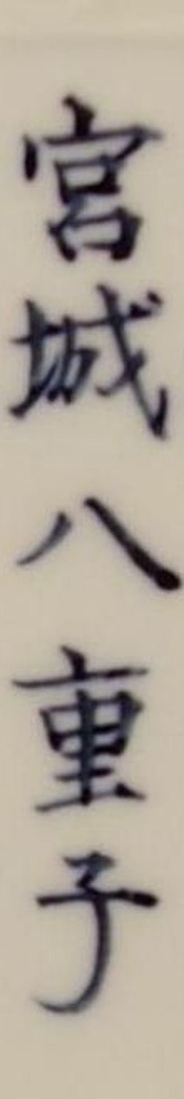宮城八重子
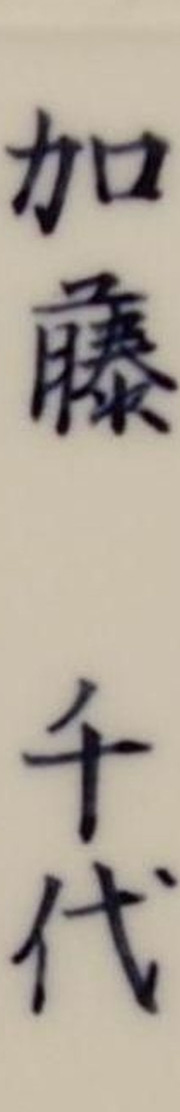加藤千代
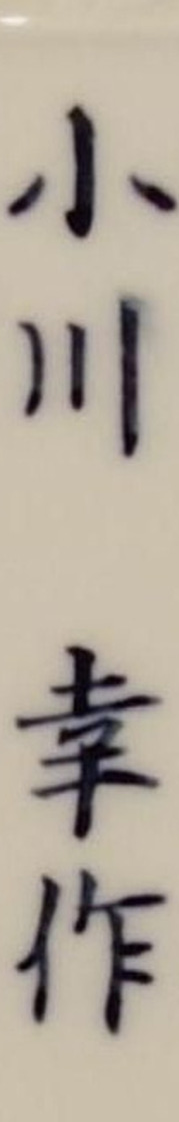小川幸作
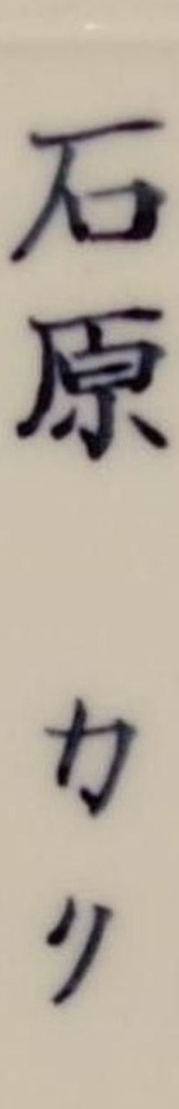石原カク
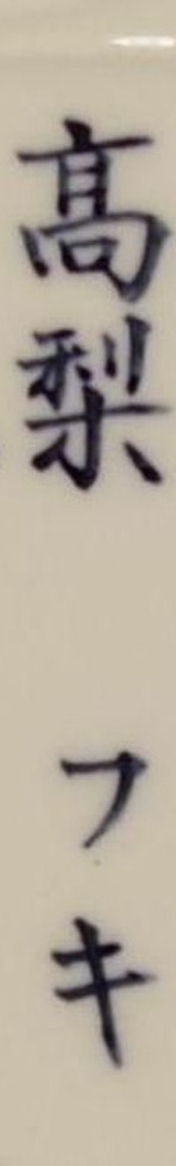高梨フキ
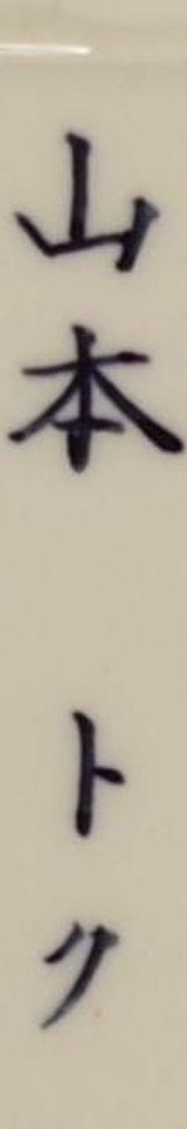山本トク
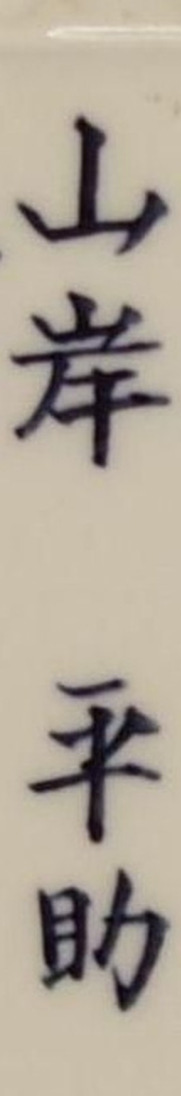山岸平助
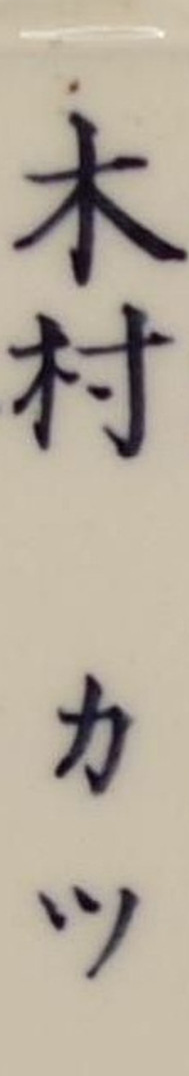木村カツ
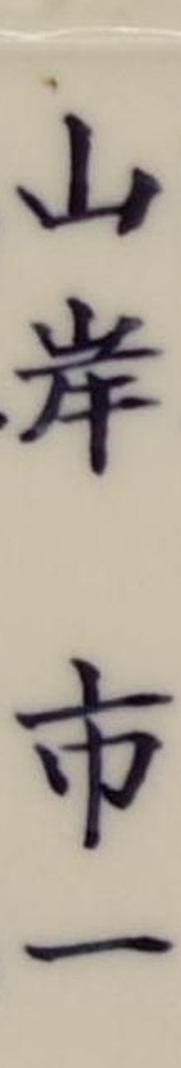山岸市一
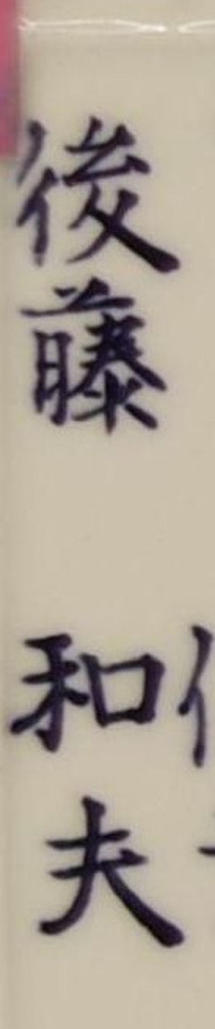後藤和夫

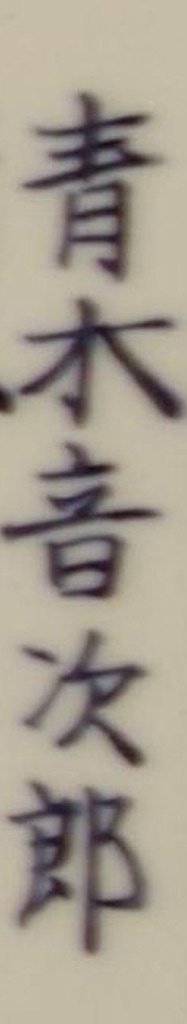青木音次郎
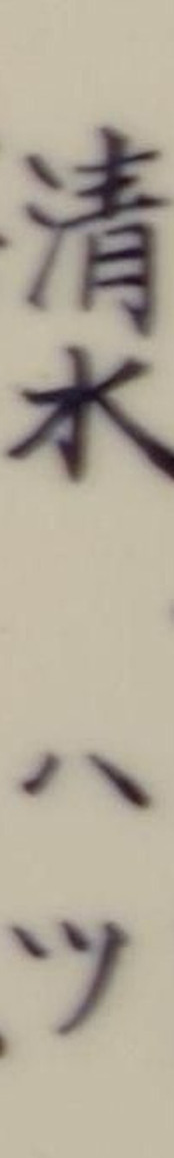清水ハツ
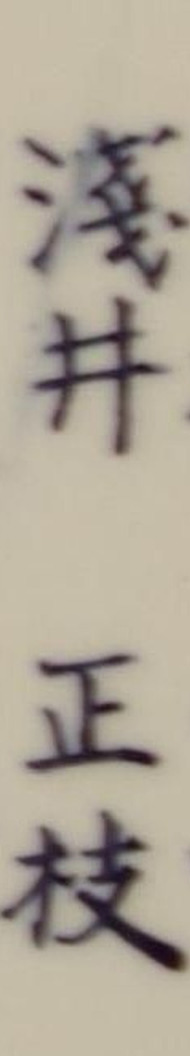浅井正枝
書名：M~S
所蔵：高野山金剛峯寺
